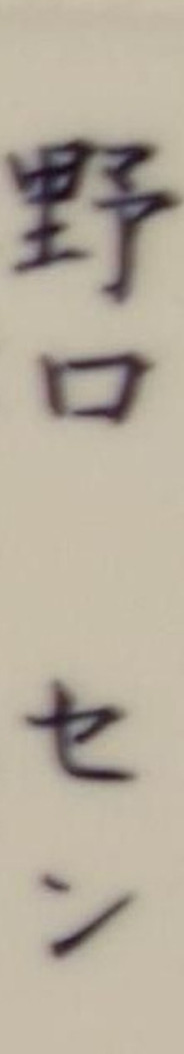野口セン
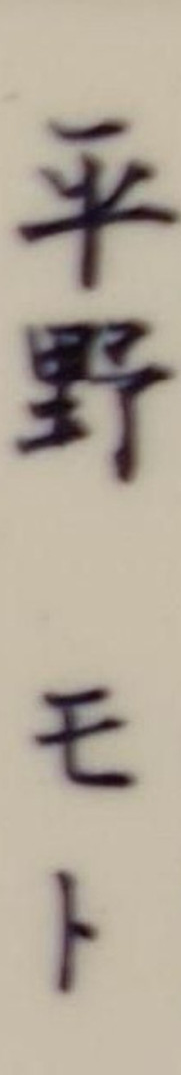平野モト
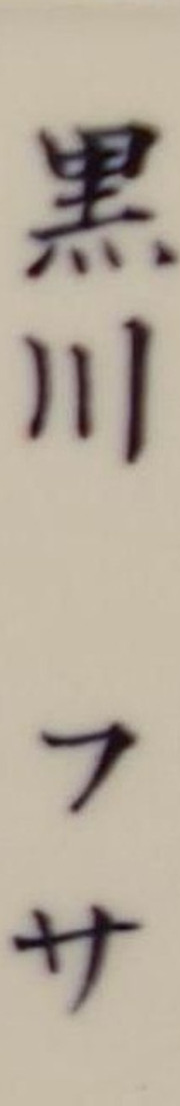黒川フサ
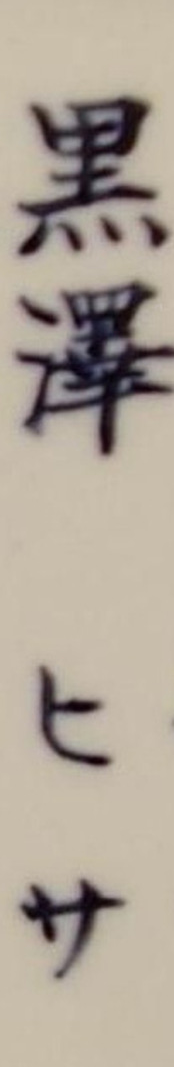黒澤ヒサ
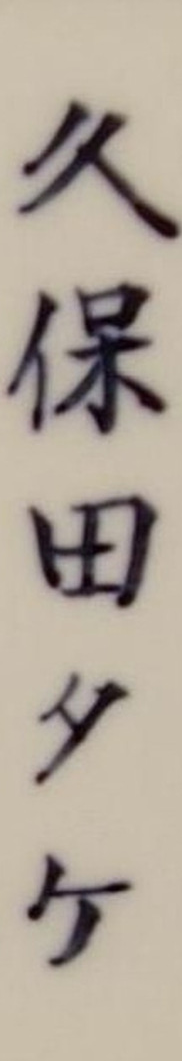久保田夕ケ
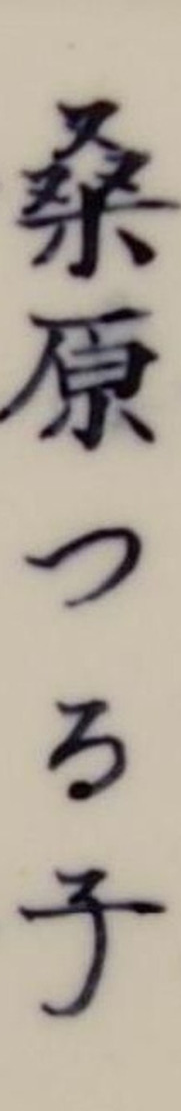桑原つる子
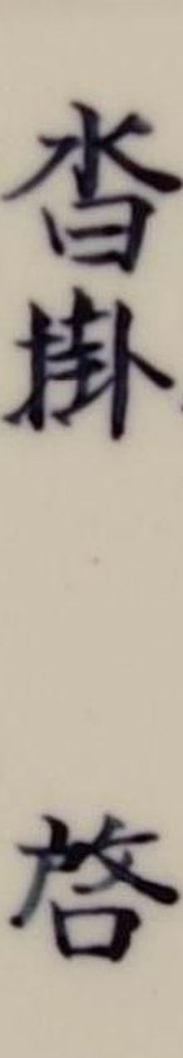沓掛啓
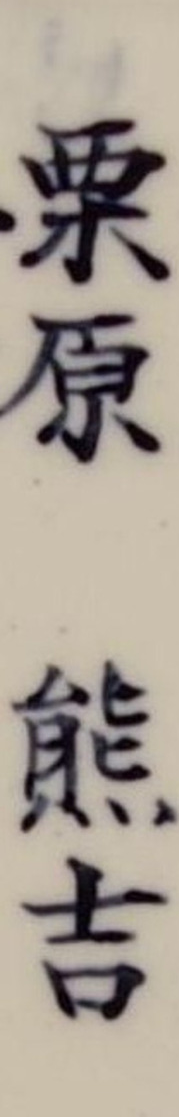栗原熊吉
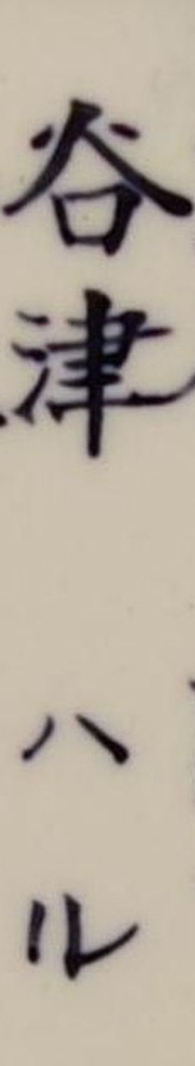谷津ハル
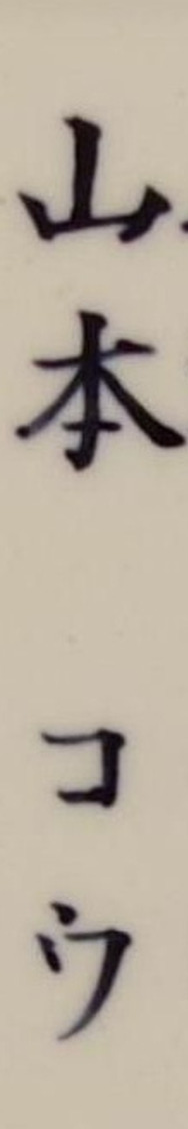山本コウ
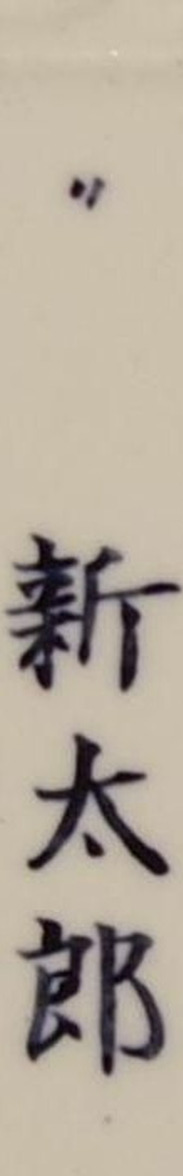新太郎
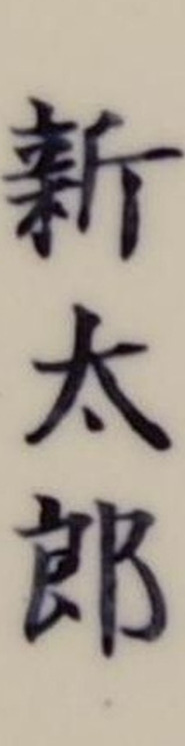新太郎
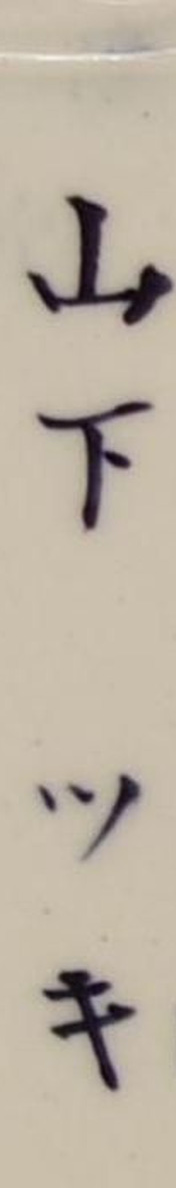山下ツキ

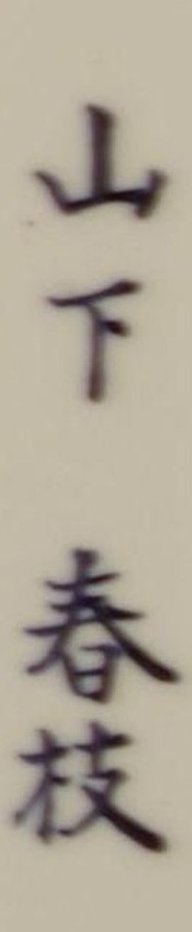山下春枝
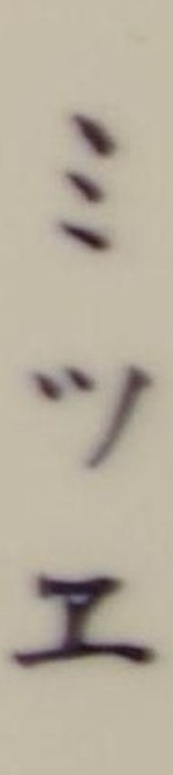ミツヱ
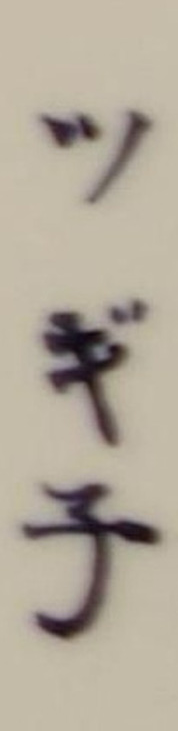ツギ子
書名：M~S
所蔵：高野山金剛峯寺
